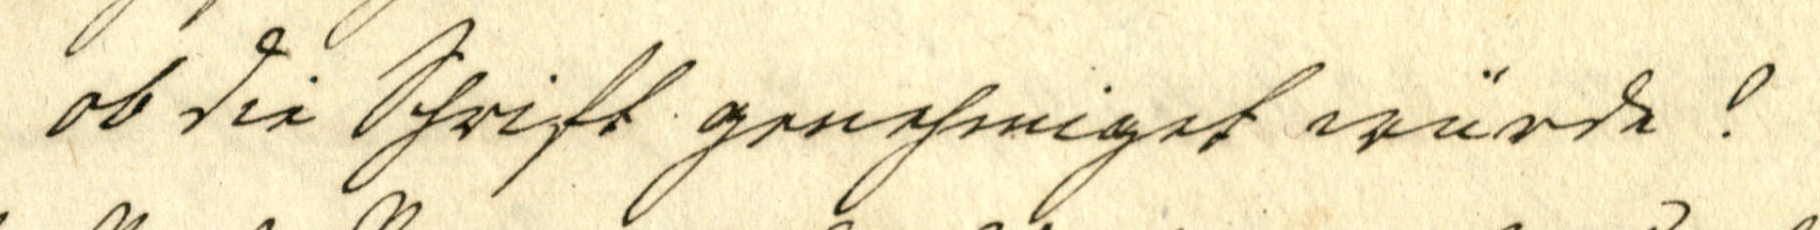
ob die Schrift genehmiget würde!
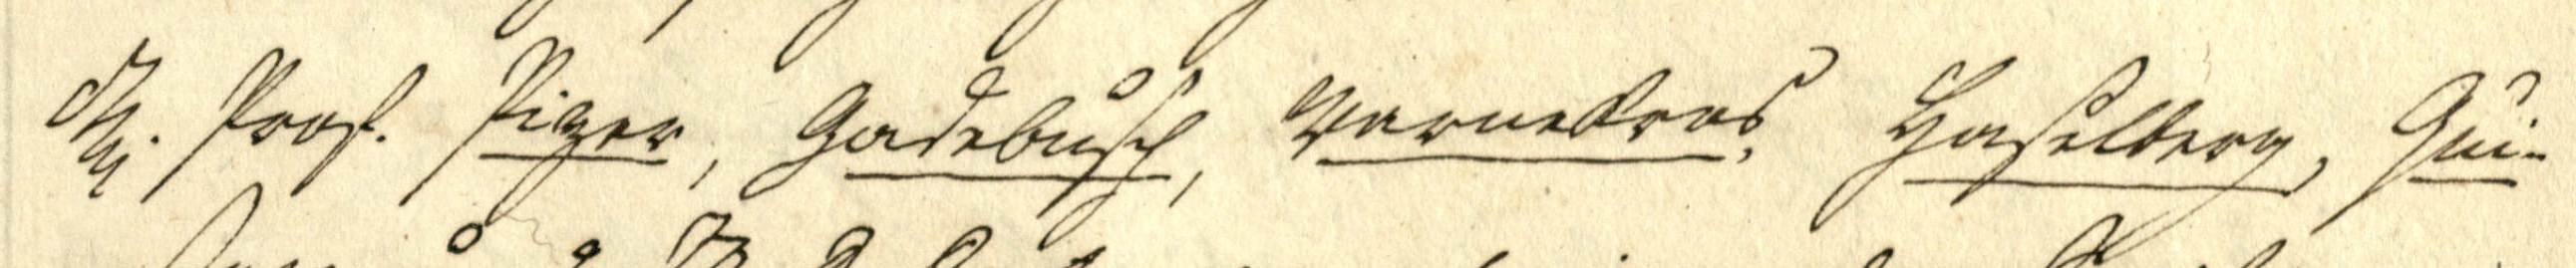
dh. Prof. Piper, Gadebusch, Warnekros, Haselberg,Qui¬
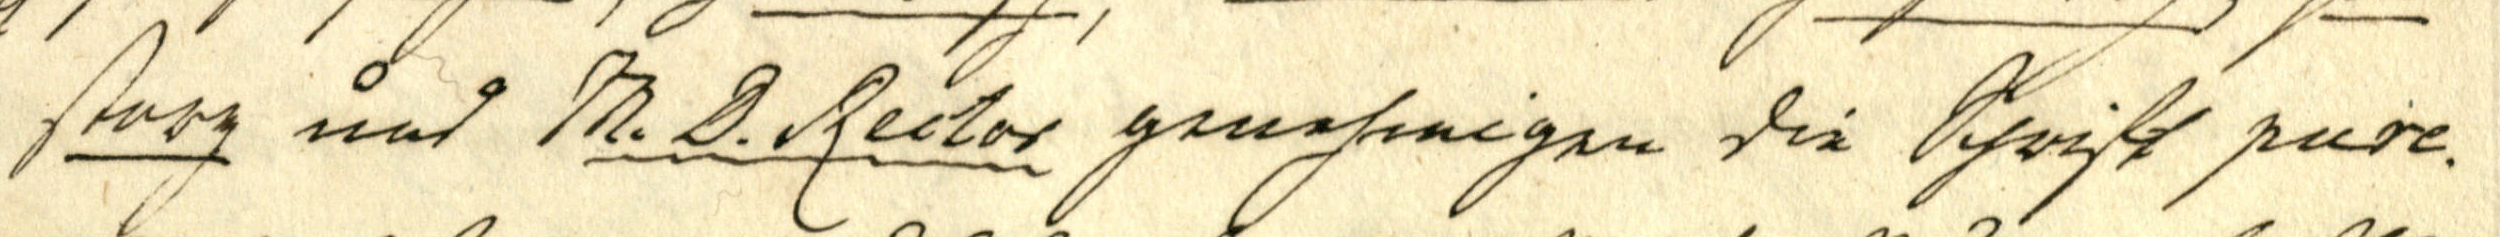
storp und M. D. Rector genehmigen die Schrift pure.
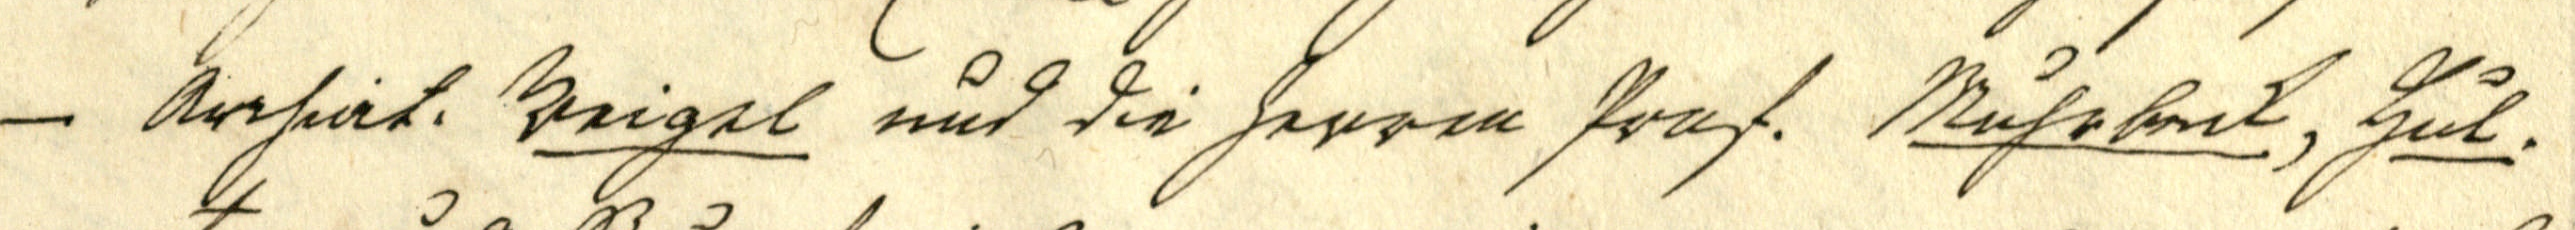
Archiat. Weigel und die herren Prof. Muhrbeck, Hul¬
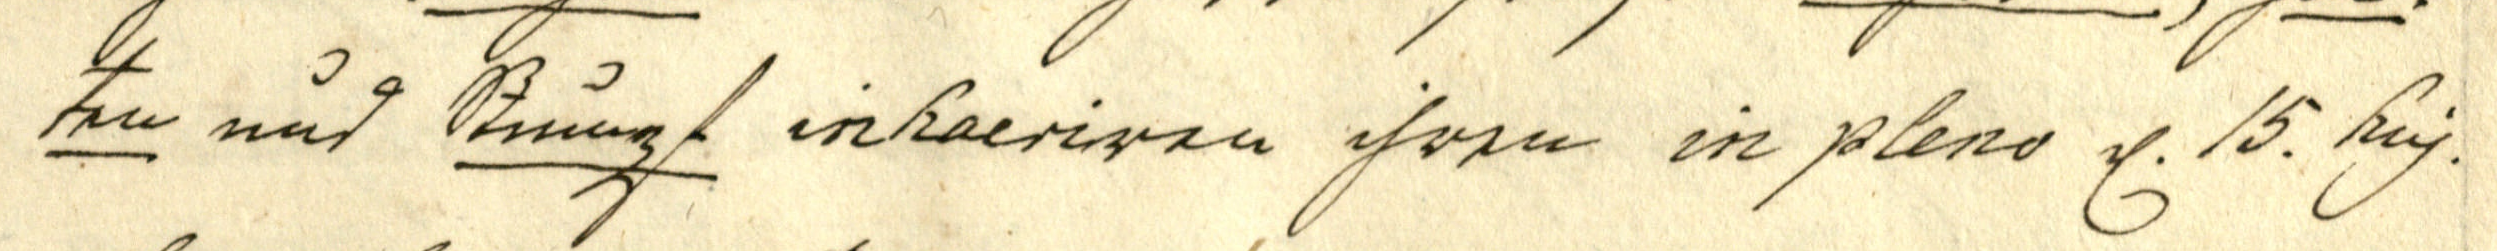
tèn und Stumpf inhaeriren ihren in pleno v. 15. huj.
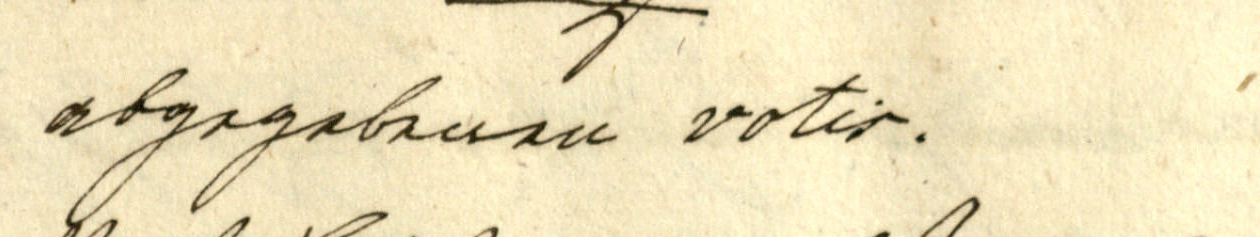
abgegebenen votis.
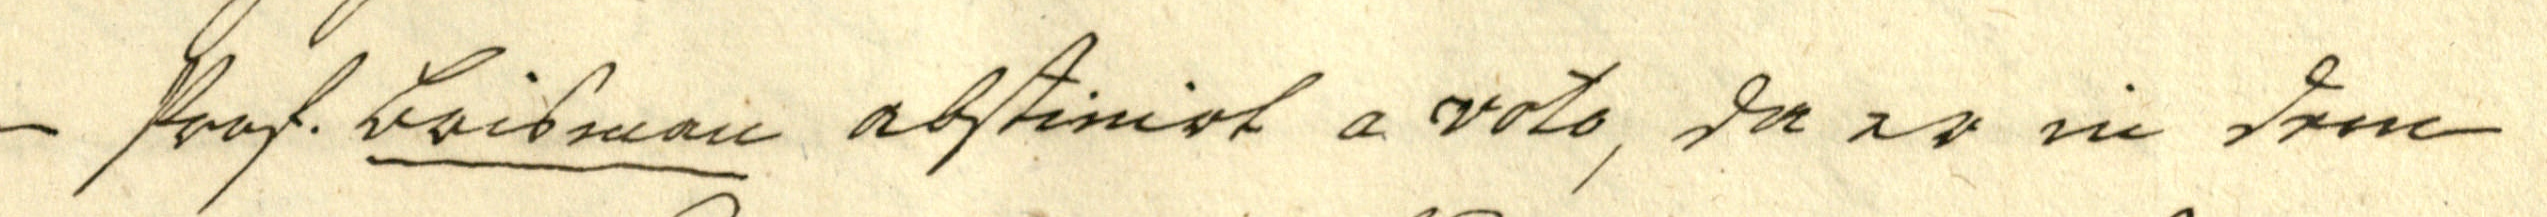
Prof. Brisman abstinirt a voto, da er in dem
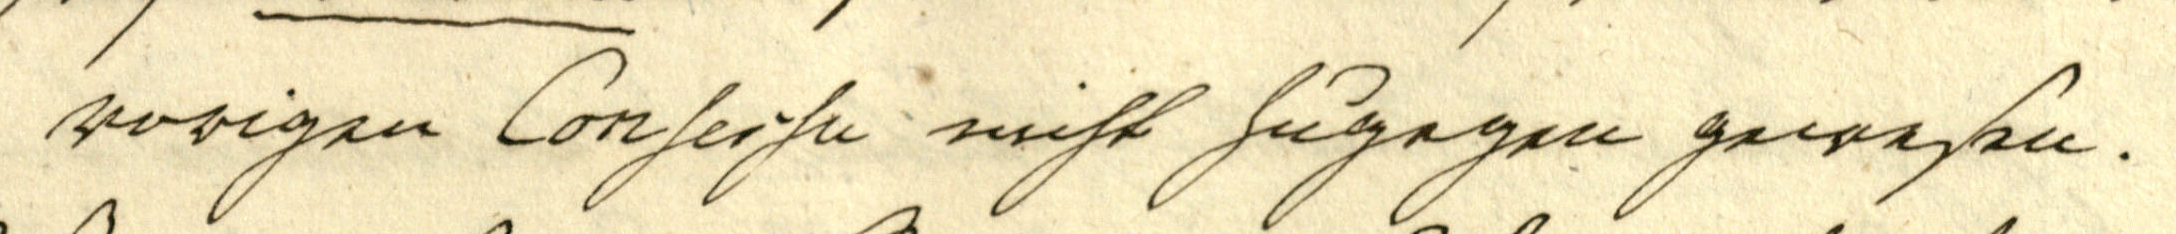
vorigen Consessu nicht zugegen gewesen.
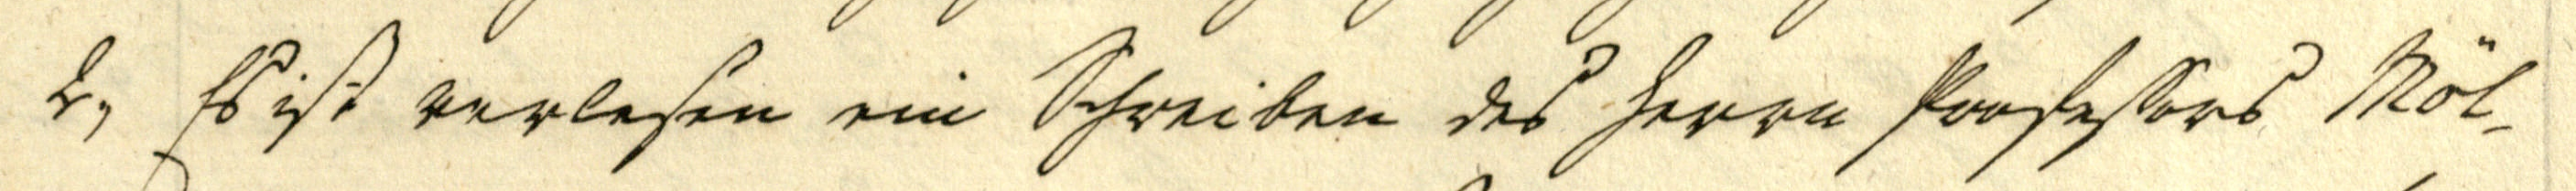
2., Es ist verlesen ein Schreiben des herrn Professors Möl¬
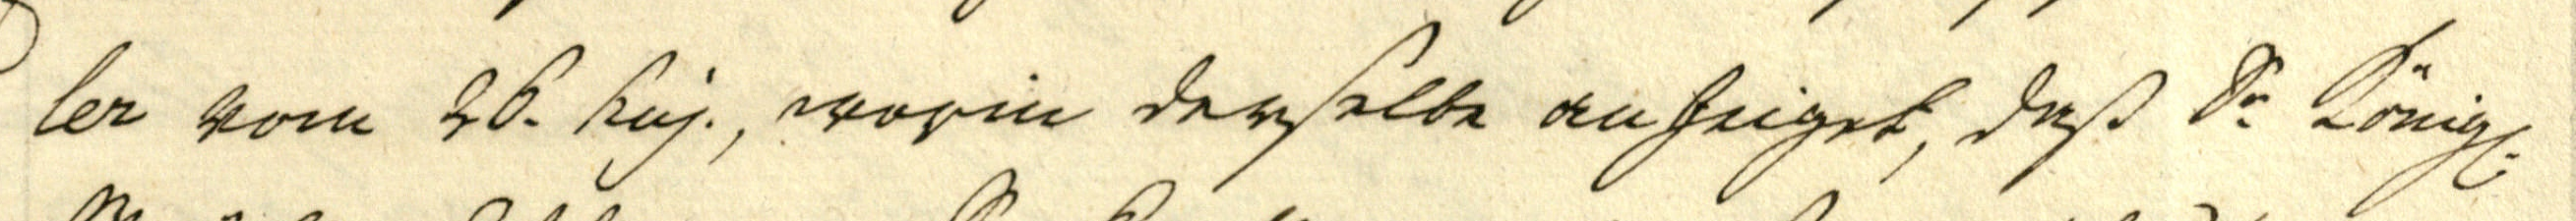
ler vom 26. huj., worin derselbe anzeiget, daß Sr. Königl.
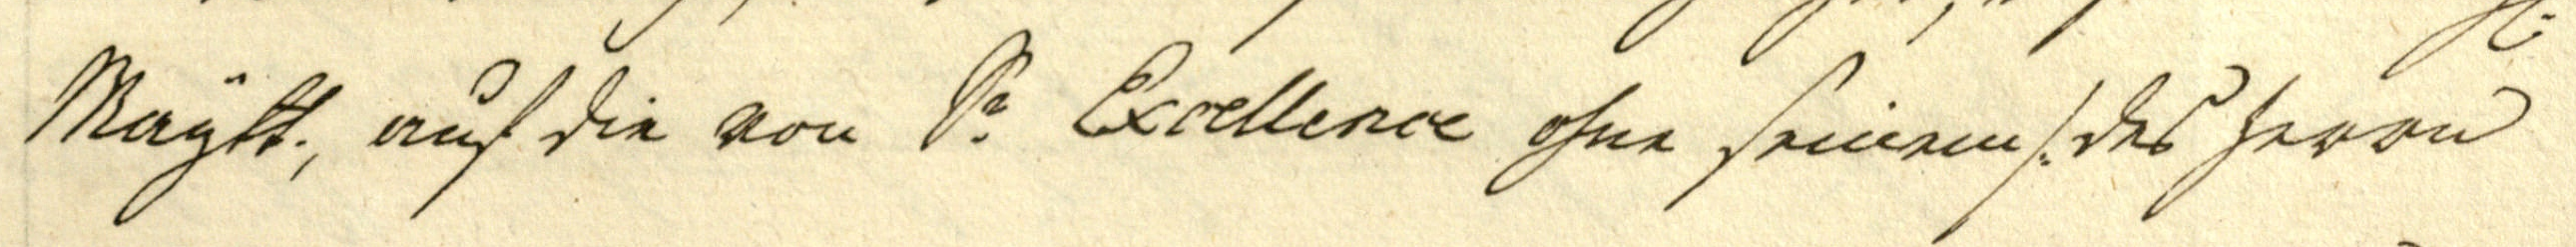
Maÿtt., auf die von Sr. Excellence ohne seinem / des herrn
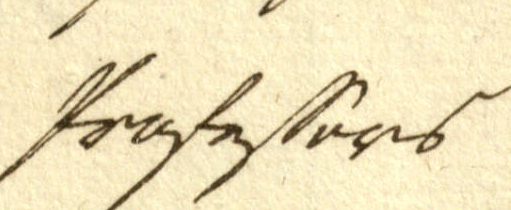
Professors
